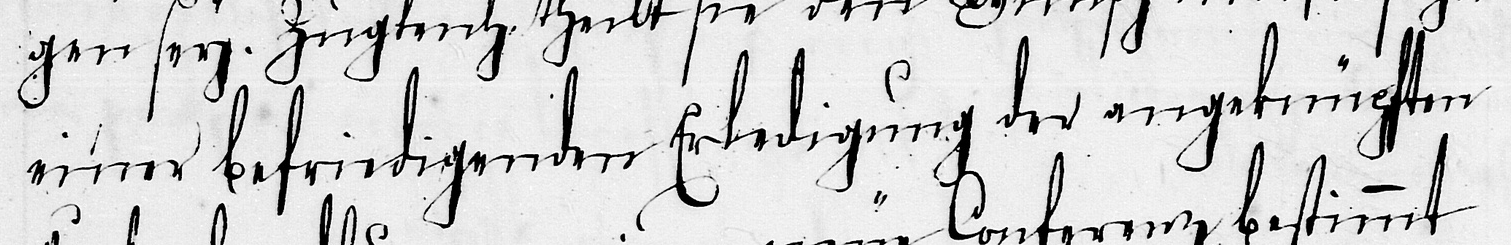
einer befriedigenden Erledigung der angeknüpften
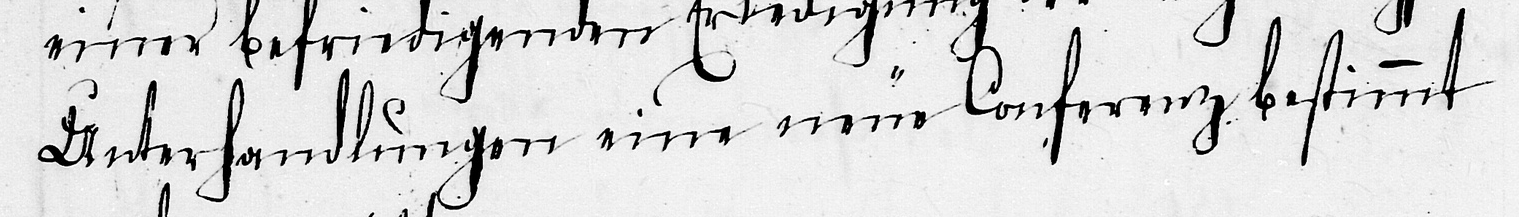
Unterhandlungen eine neue Conferenz bestimmt
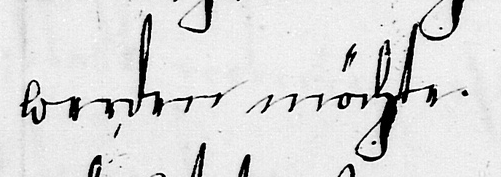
werden möchte.
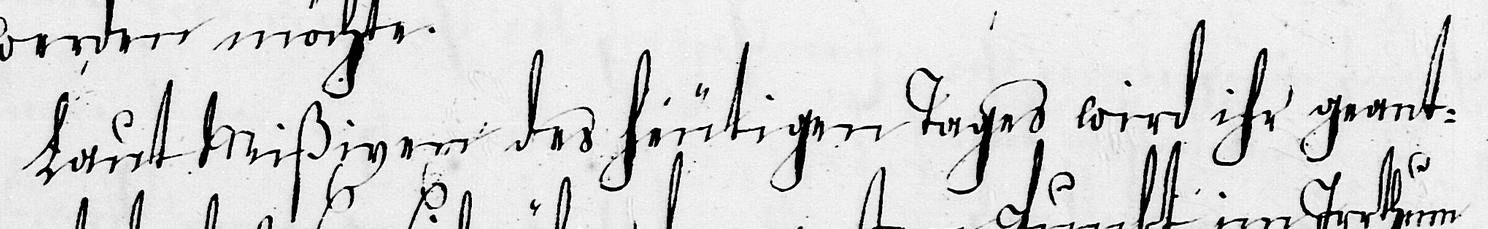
Laut Mißiven des heutigen Tages wird ihr geant¬
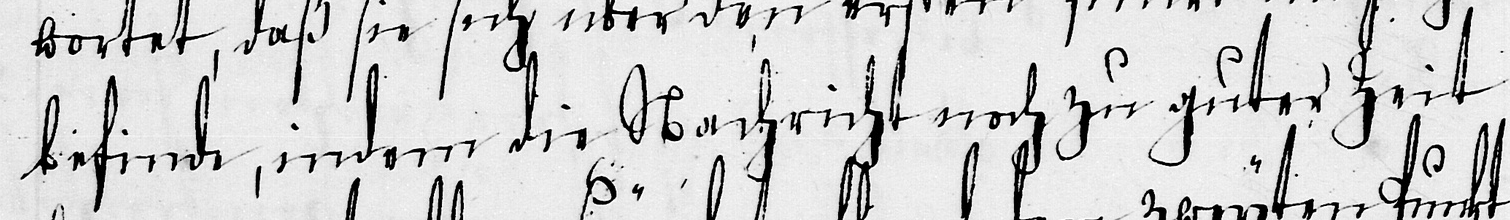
befinde, indem die Nachricht noch zu guter Zeit
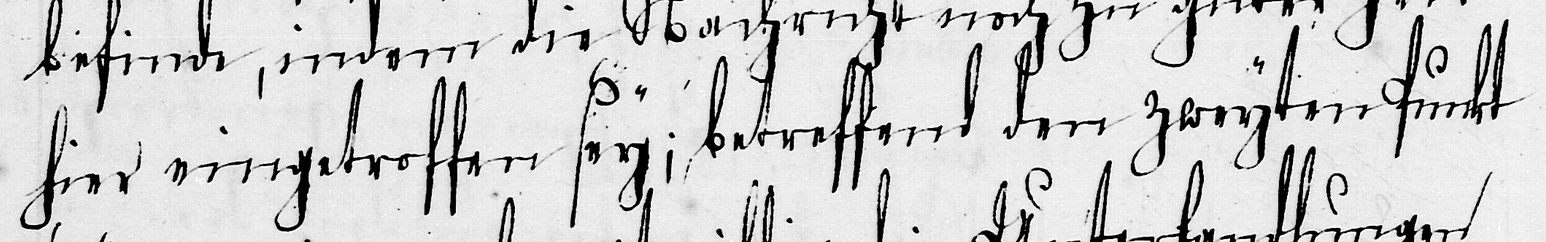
hier eingetroffen sey; betreffend den zweyten Punkt
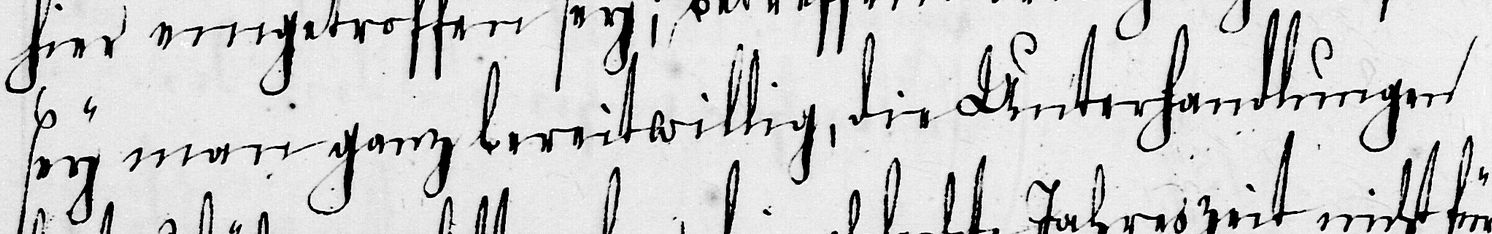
sey man ganz bereitwillig, die Unterhandlungen
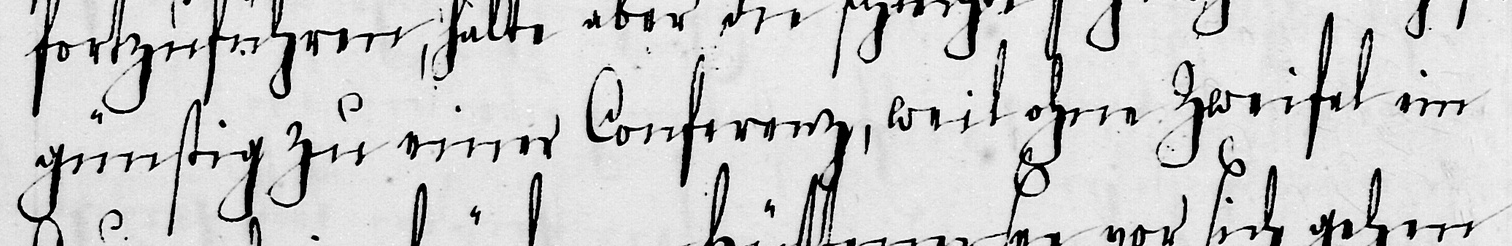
günstig zu einer Conferenz, weil ohne Zweifel ein
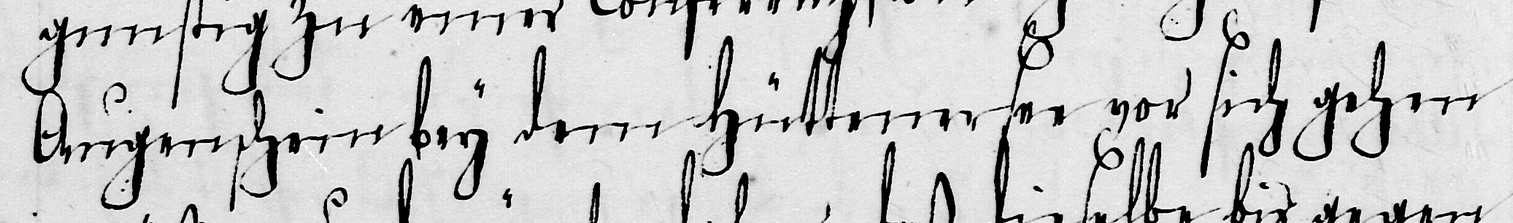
Augenschein bey dem Hüttenersee vor sich gehen
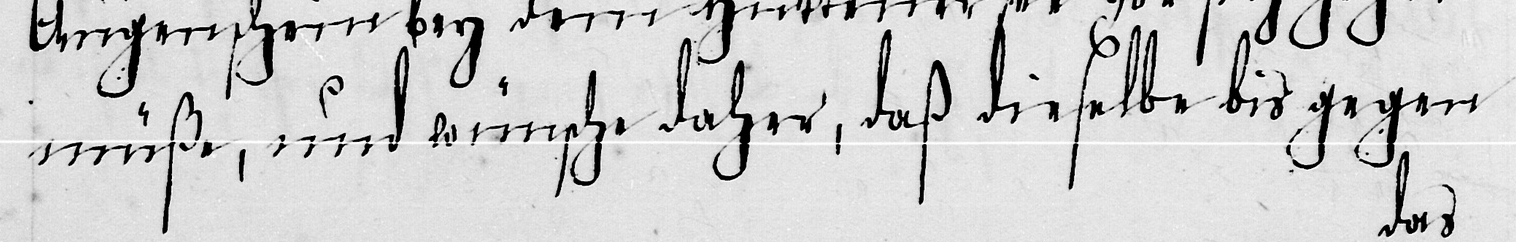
müße, und wünsche daher, daß dieselbe bis gegen
